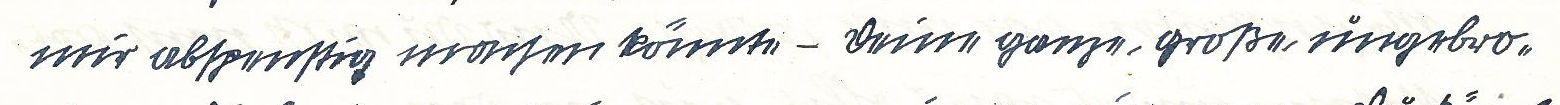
mir abspenstig machen könnte – Deine ganze, große, ungebro¬
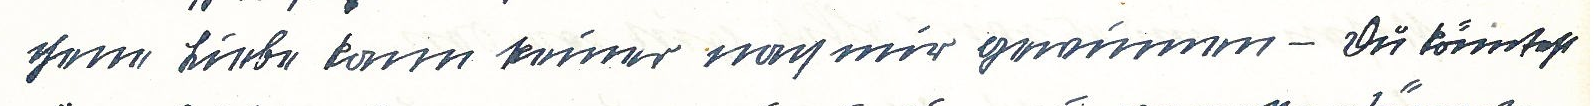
chene Liebe kann keiner nach mir gewinnen – Du könntest
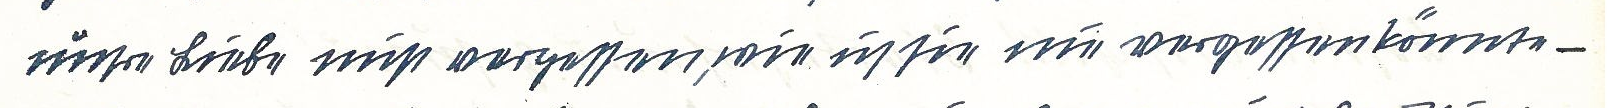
unsre Liebe nicht vergessen, wie ich sie nie vergessen könnte –
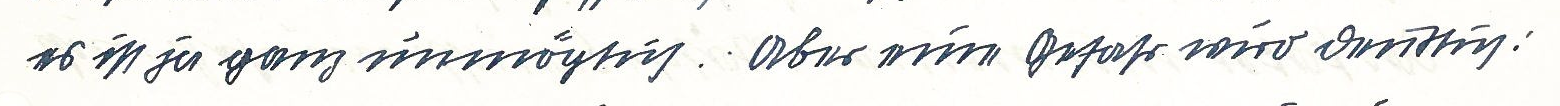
es ist ja ganz unmöglich. Aber eine Gefahr wird deutlich:
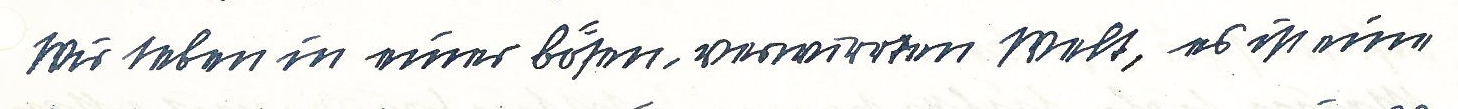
Wir leben in einer bösen verwirrten Welt, es ist eine
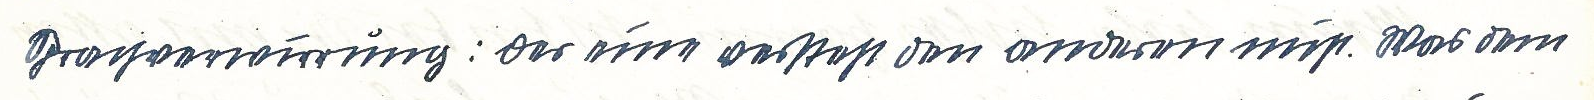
Sprachverwirrung: Der eine versteht den anderen nicht. Was dem
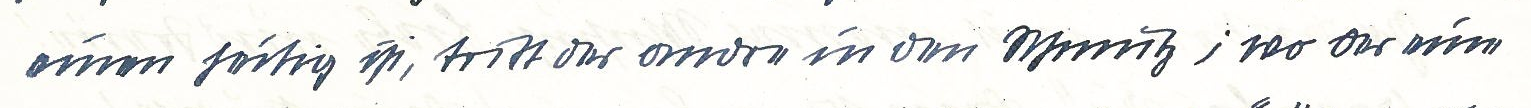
einen heilig ist, tritt der andere in den Schmutz; wo der eine
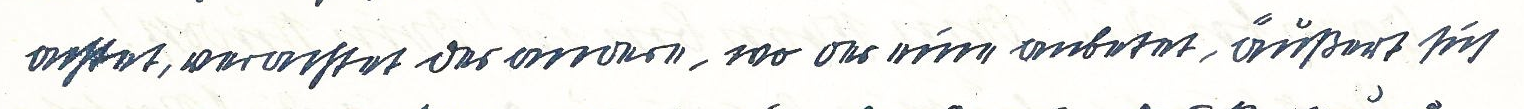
achtet, verachtet der andere, wo der eine anbetet, äußert sich
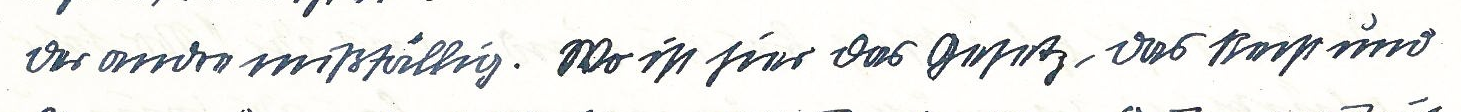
der andre mißfällig. Wo ist hier das Gesetz, das Recht und
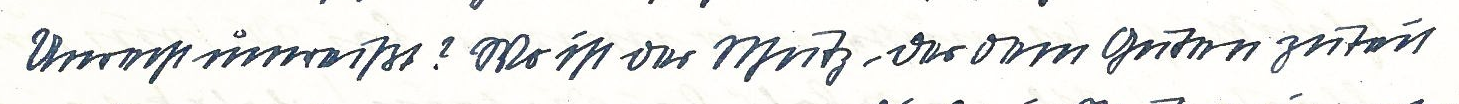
Unrecht umreißt? Wo ist der Schutz, der dem Guten zuteil
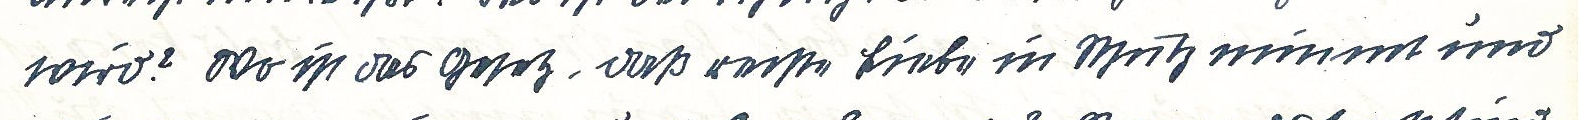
wird? Wo ist das Gesetz, daß rechte Liebe in Schutz nimmt und
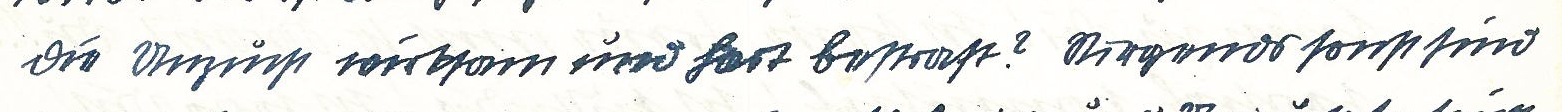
die Unzucht wirksam und hart bestraft? Nirgends sonst sind
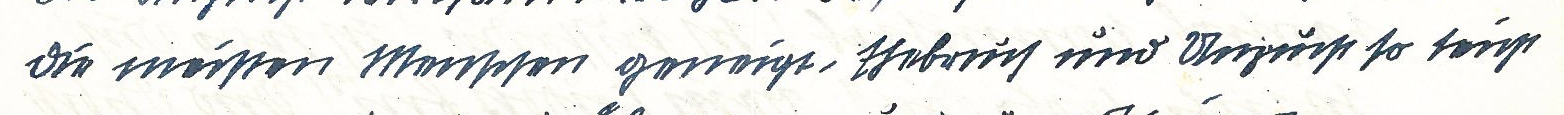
die meisten Menschen geneigt, Ehebruch und Unzucht so leicht
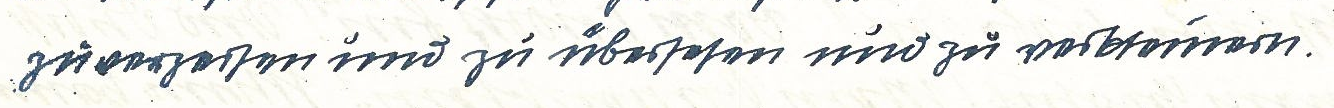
zu verzeihen und zu übersehen und zu verkleinern –
